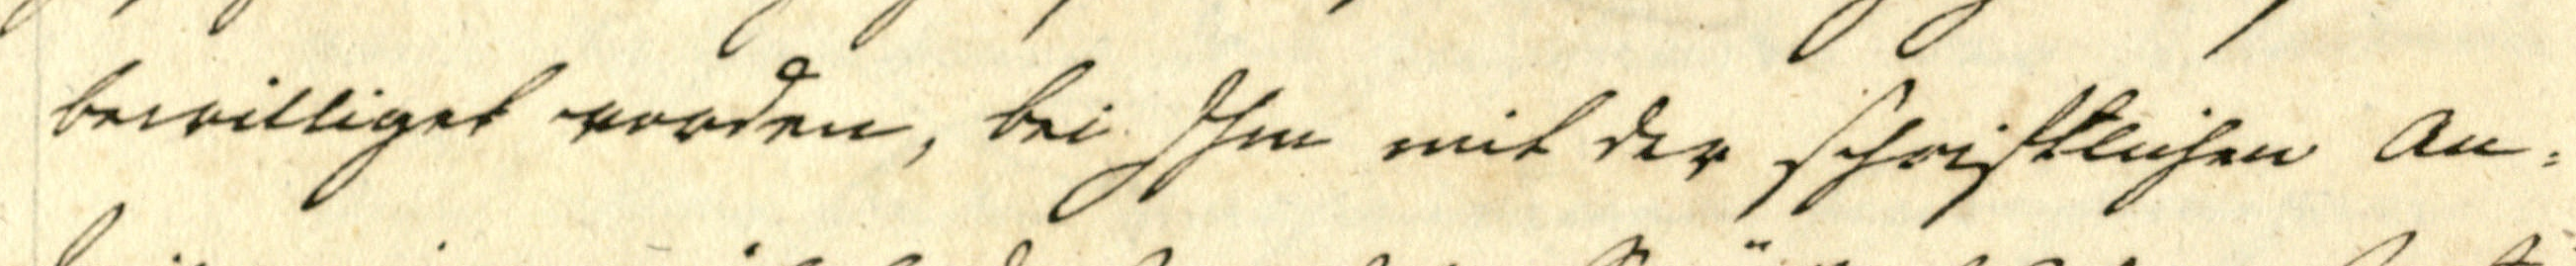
bewilliget worden, bei Ihm mit der schriftlichen An¬
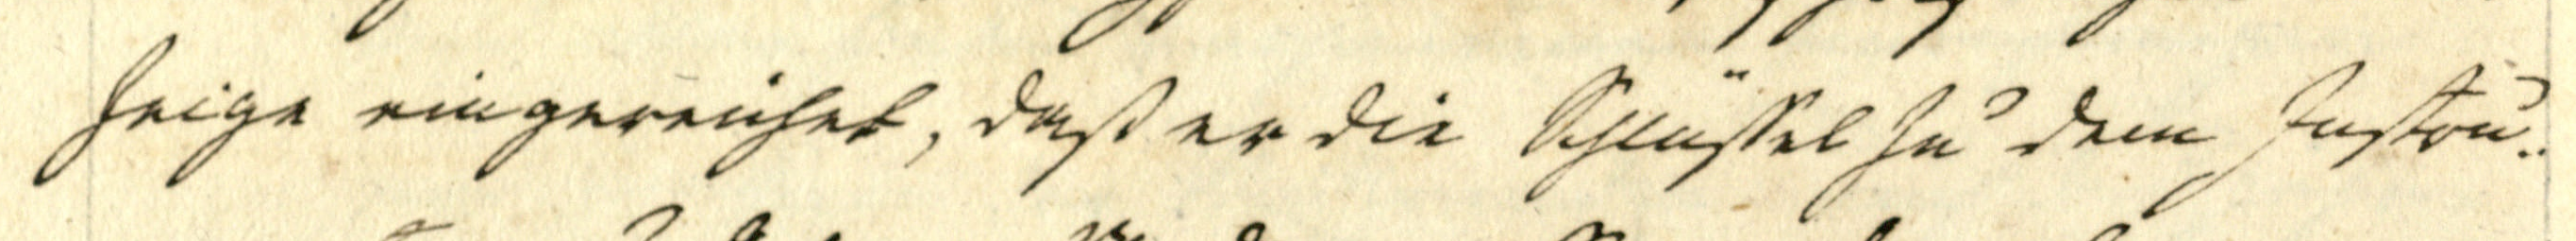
zeige eingereichet, daß er die Schlüssel zu dem Instru¬
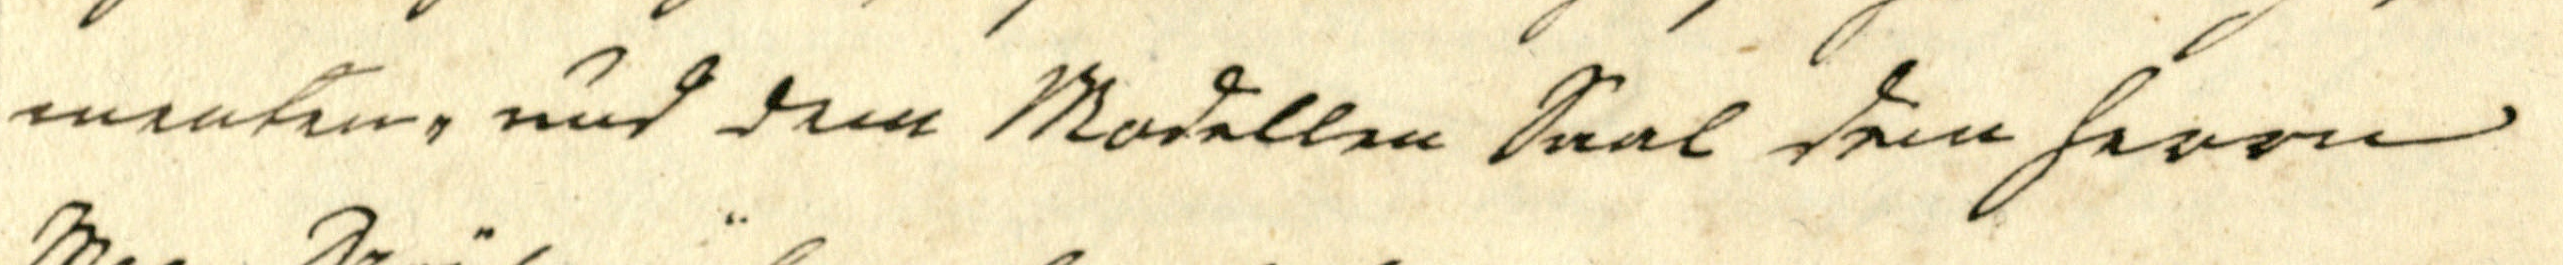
menten- und dem Modellen Saal dem Herrn
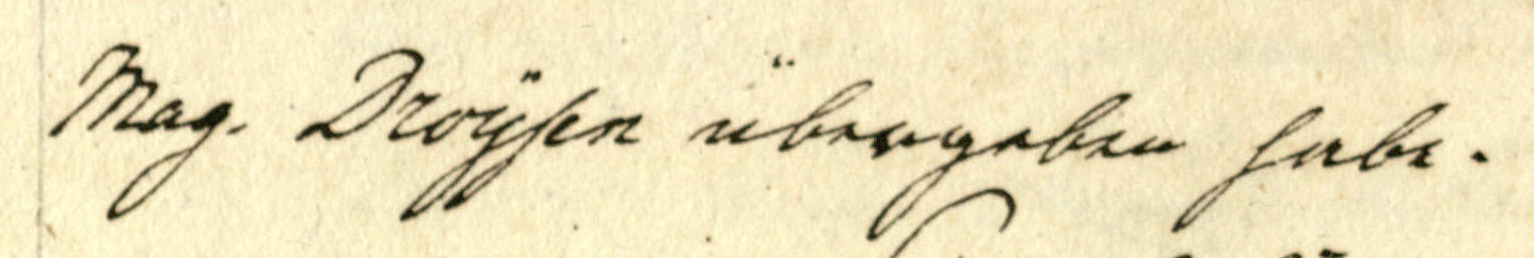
Mag. Droÿsen übergeben habe.
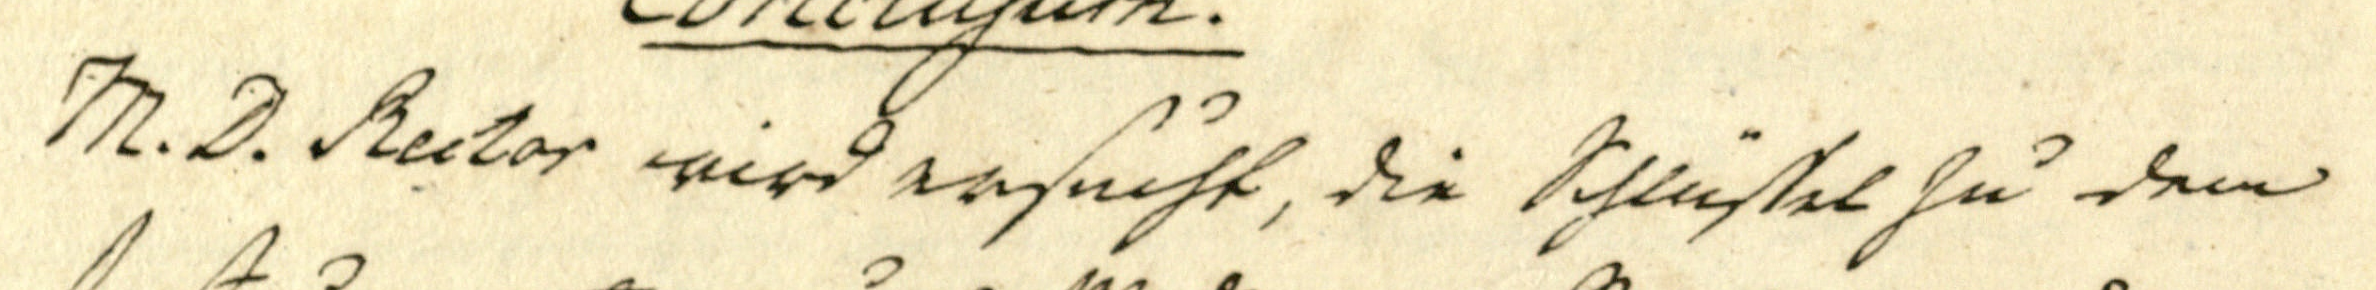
M. D. Rector wird ersucht, die Schlüssel zu dem
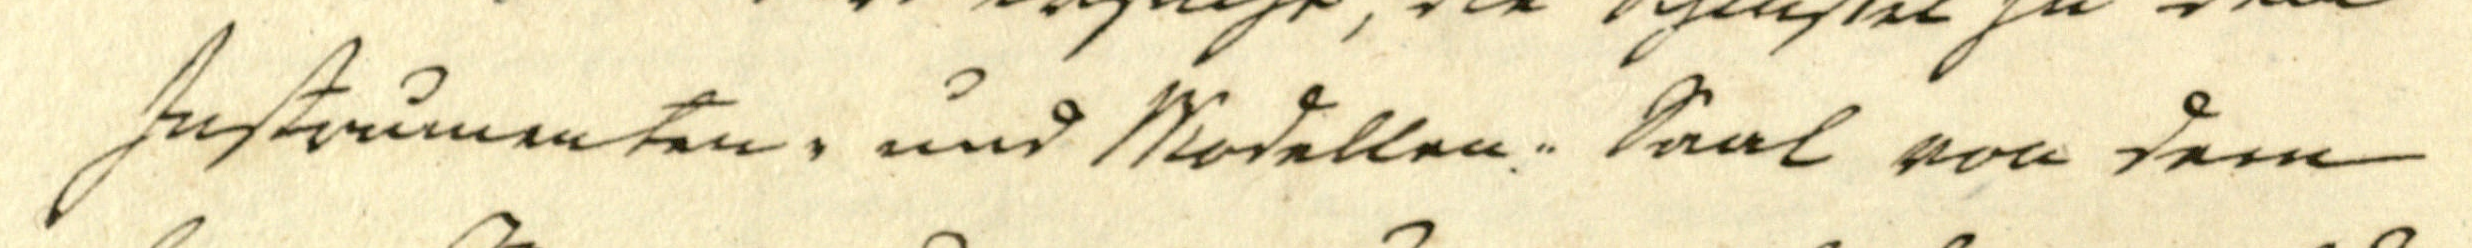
Instrumenten- und Modellen- Saal von dem
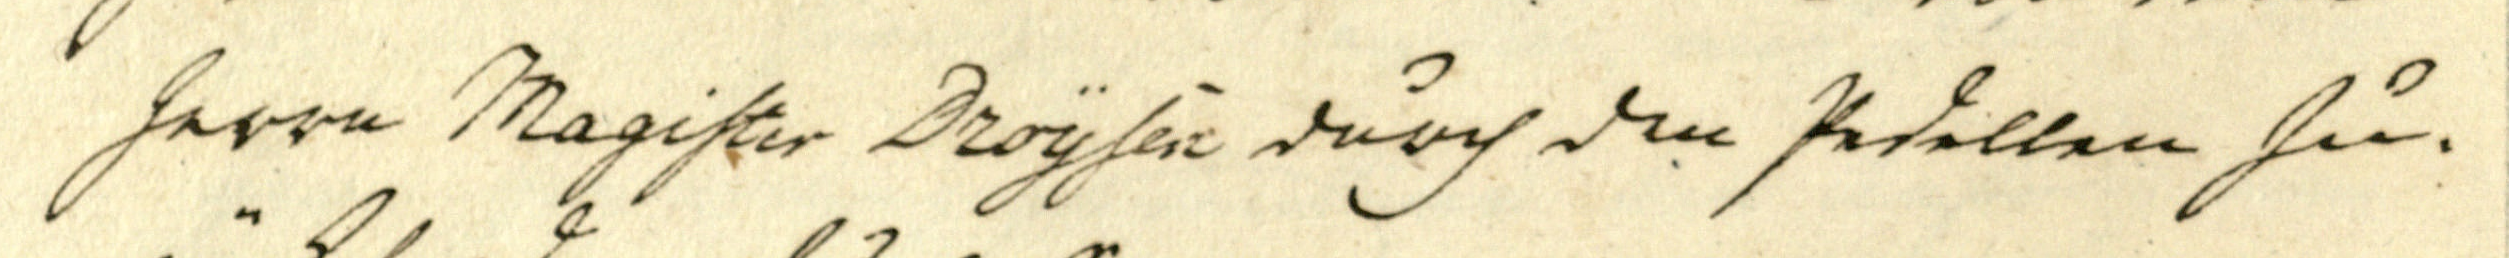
Herrn Magister Droÿsen durch den Pedellen zu¬
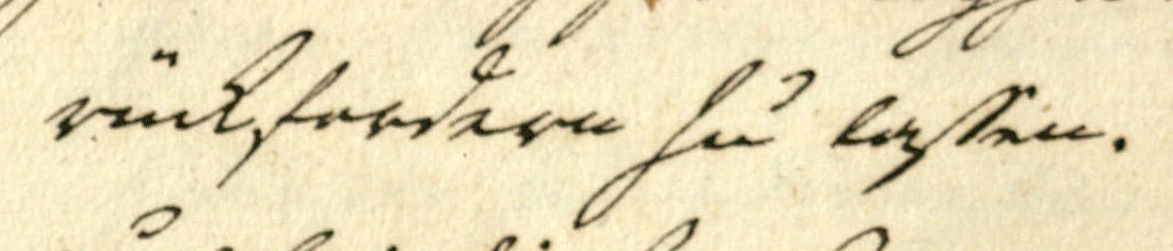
rückfordern zu lassen.
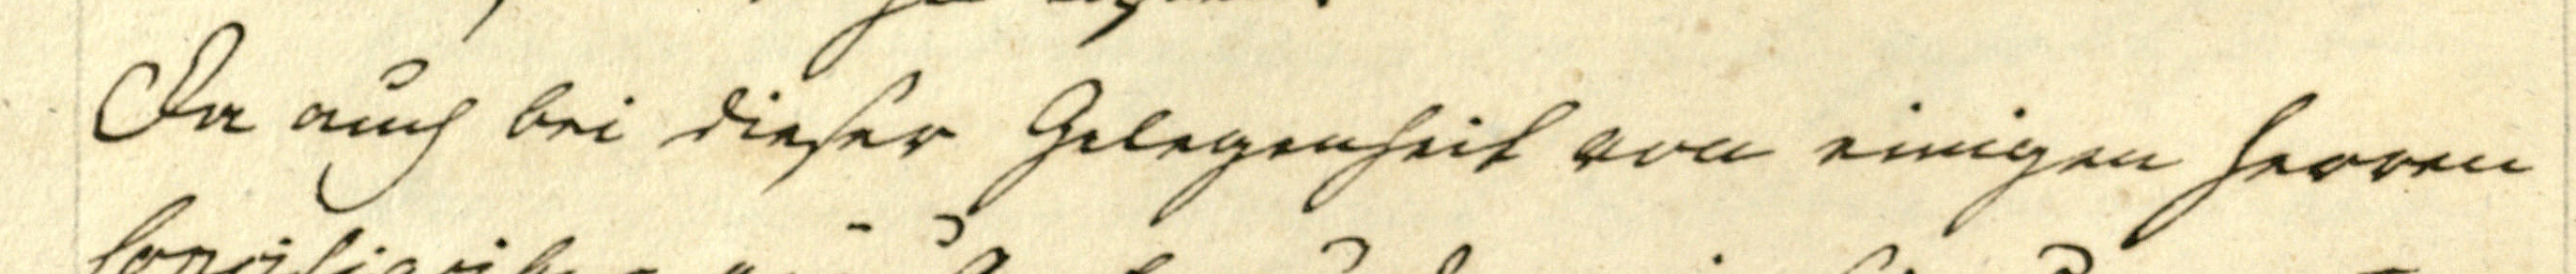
Da auch bei dieser Gelegenheit von einigen Herren
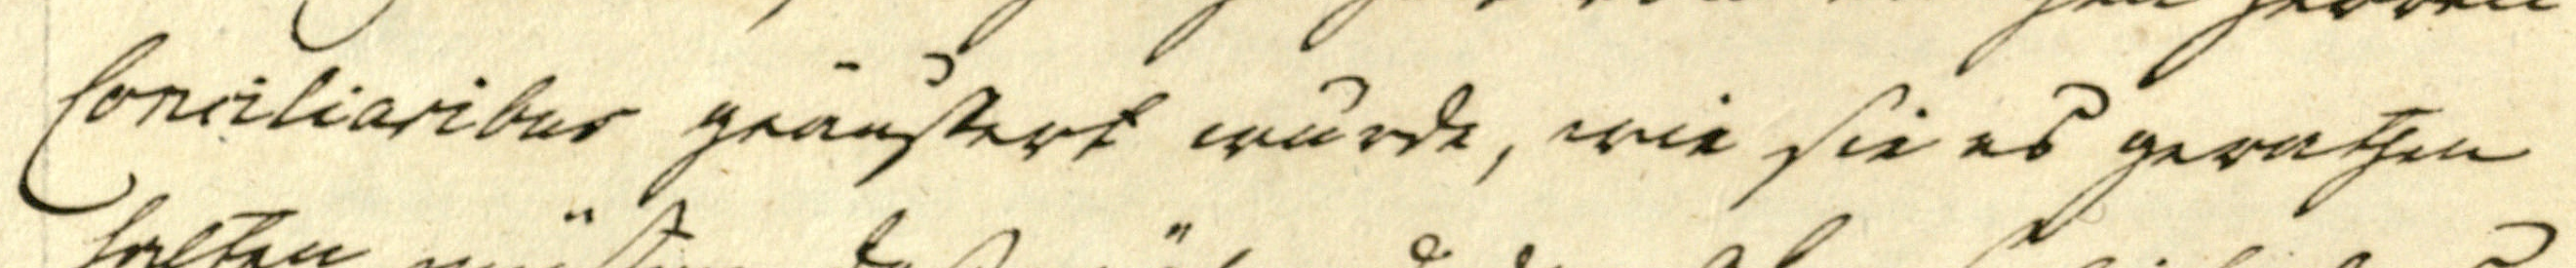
Conciliaribus geäussert wurde, wie sie es gerathen
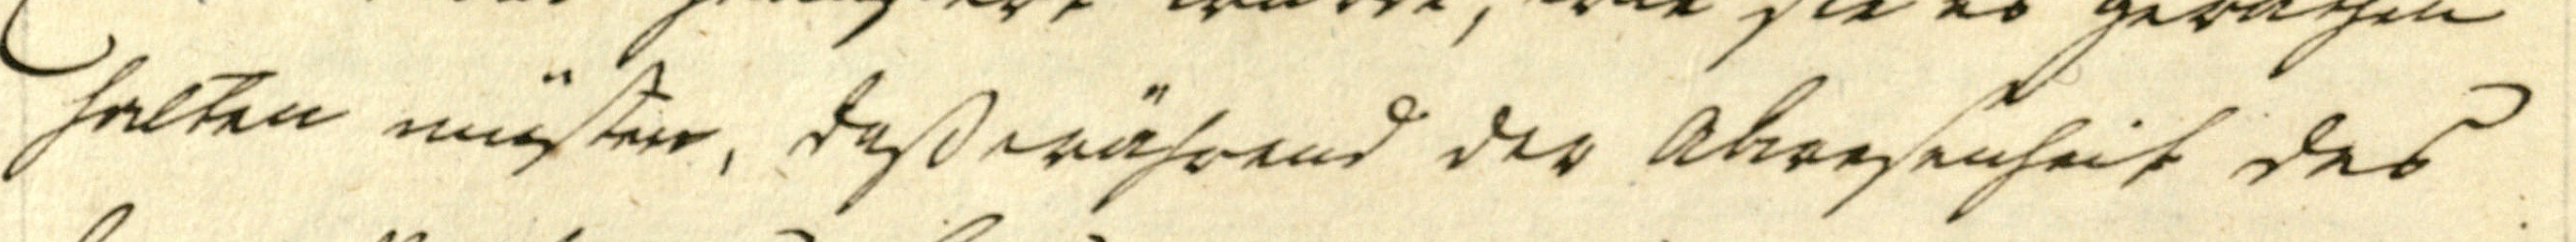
halten müßten, daß während der Abwesenheit des
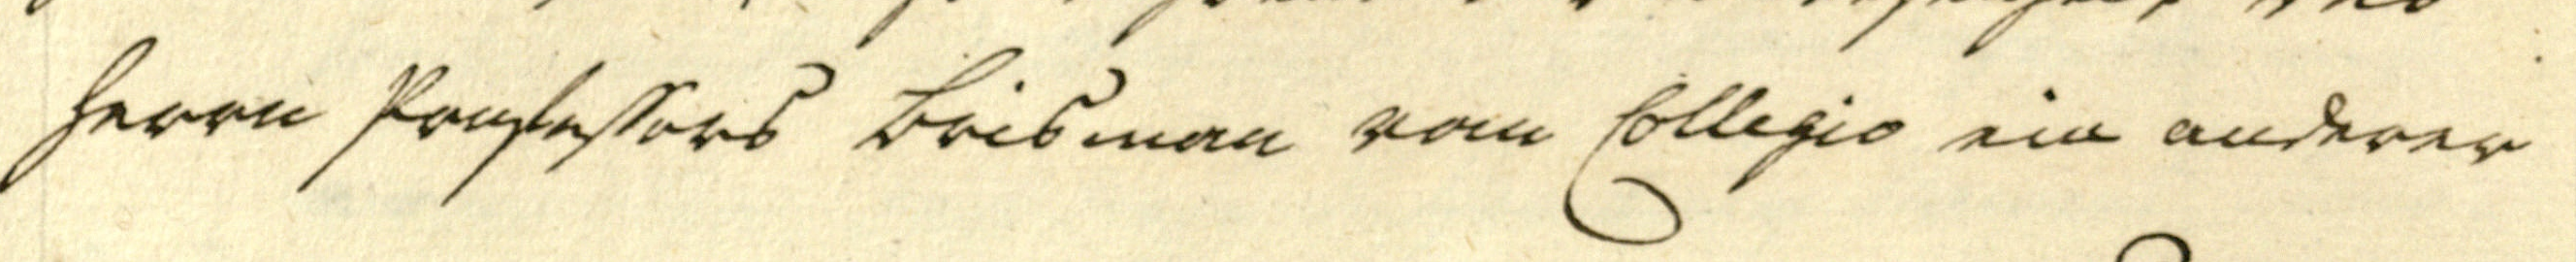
Herrn Professors Brisman vom Collegio ein anderer
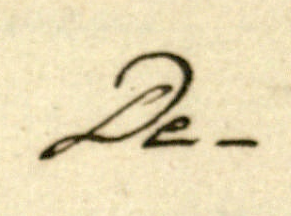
De.
